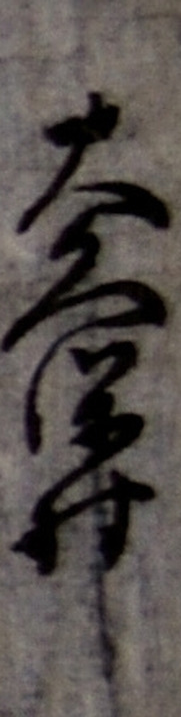大久保村
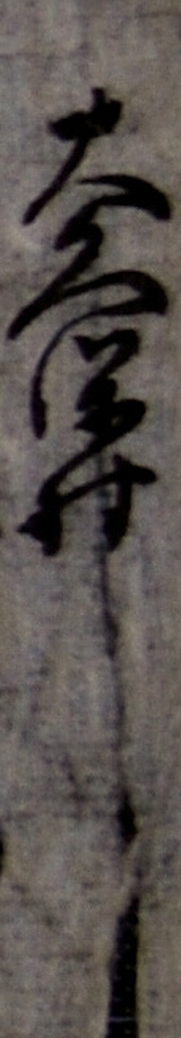大久保村
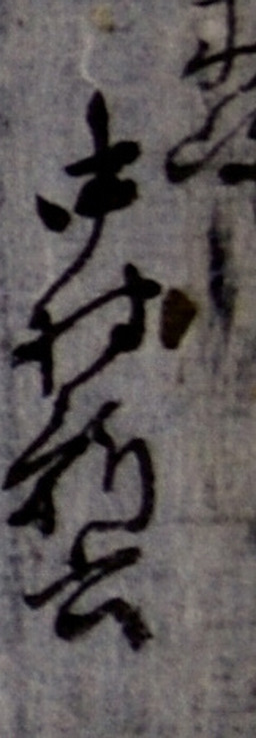中村新六
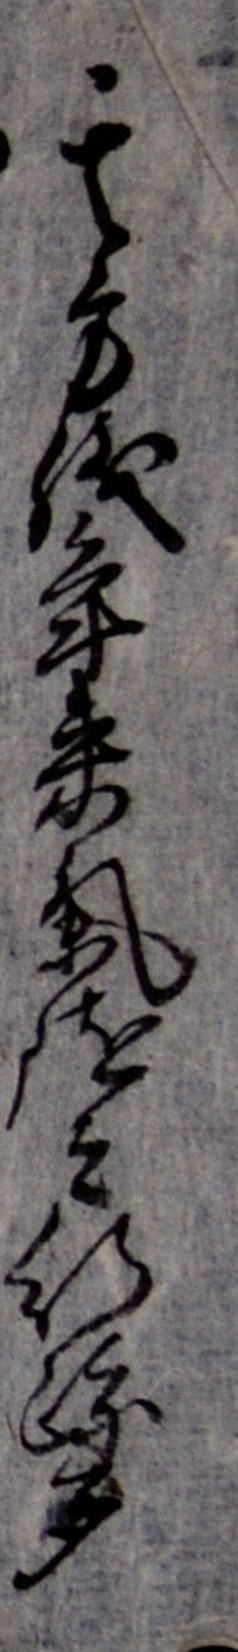其方儀年来氣之行跡多
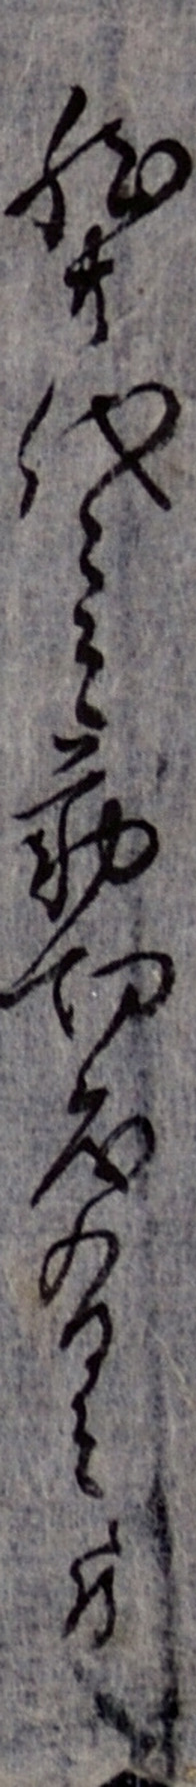然共代々之勤切名有之ニ付
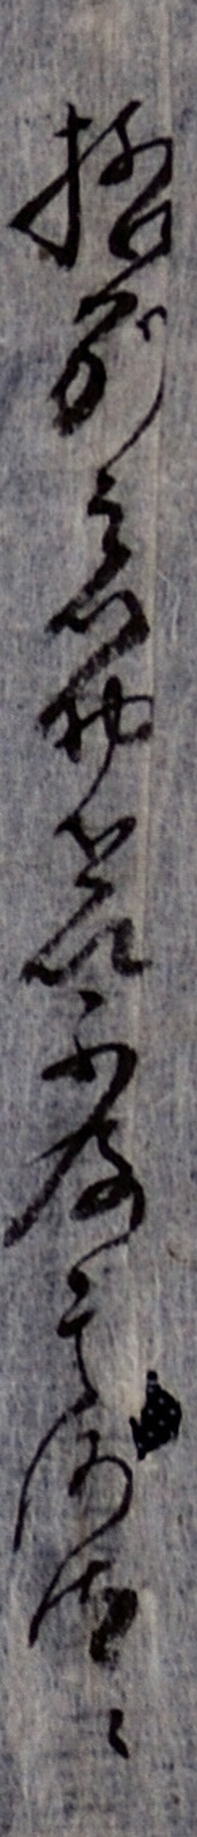格別之筋を以不及其沙汰二
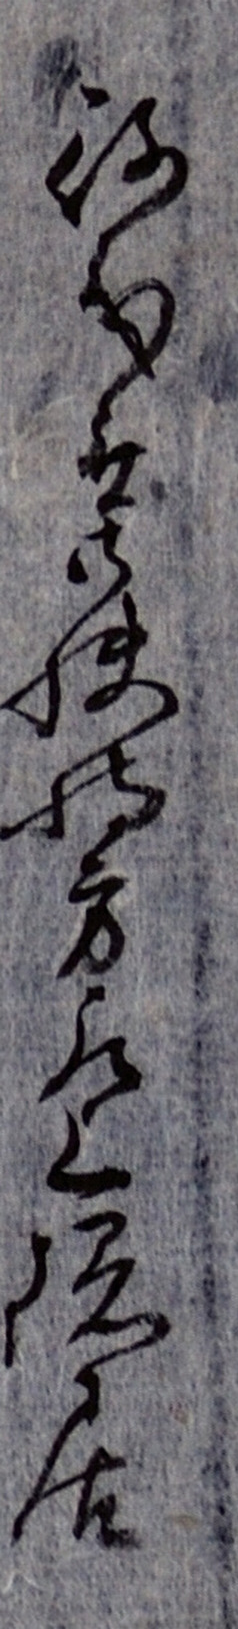役儀在御扶持方取上隠居
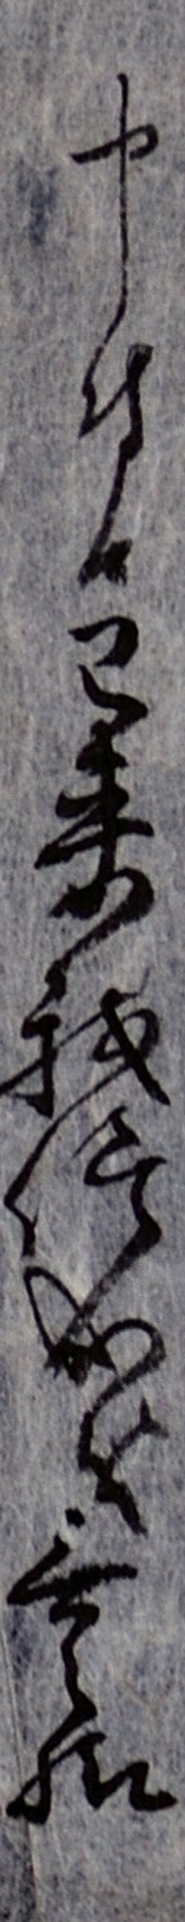申付候已来我儘成義無之様
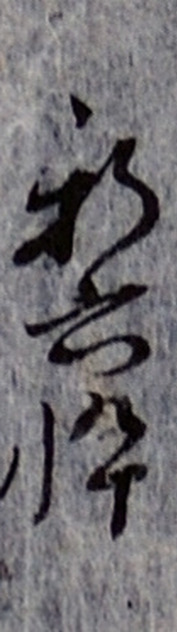新六倅
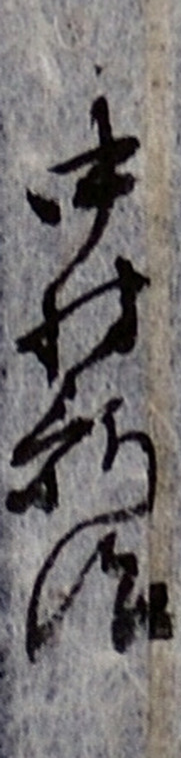中村新六
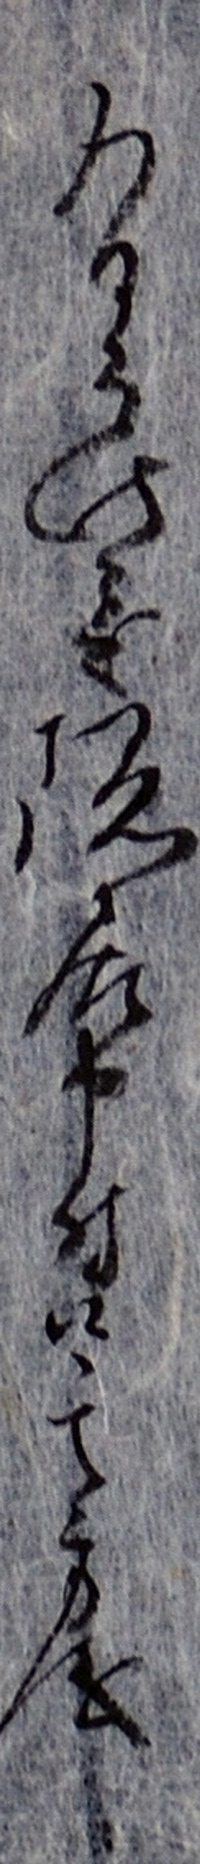有之此度隠居申付候其方儀
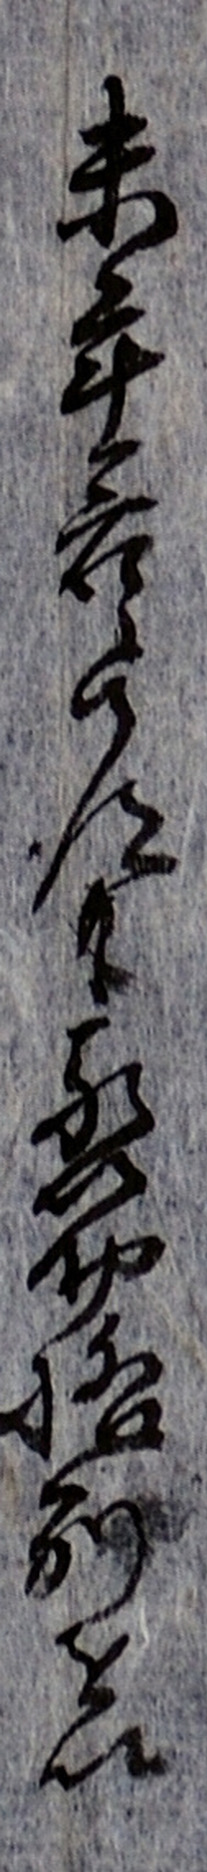未年若二候得共家筋格別を以
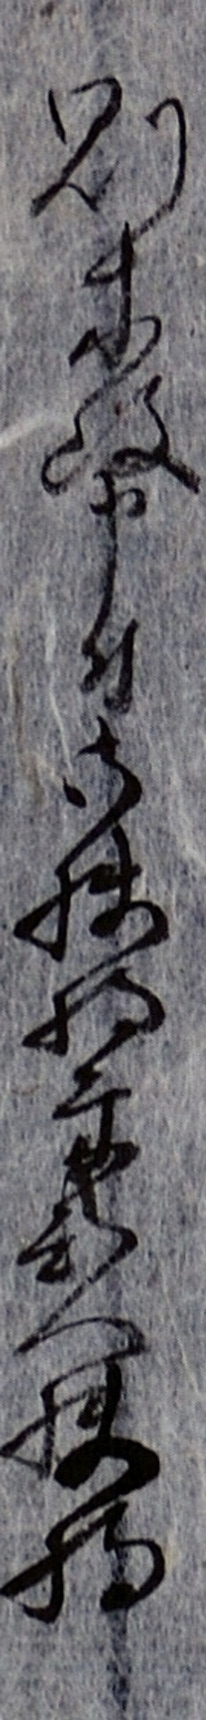則木改申付御扶持米弐人扶持
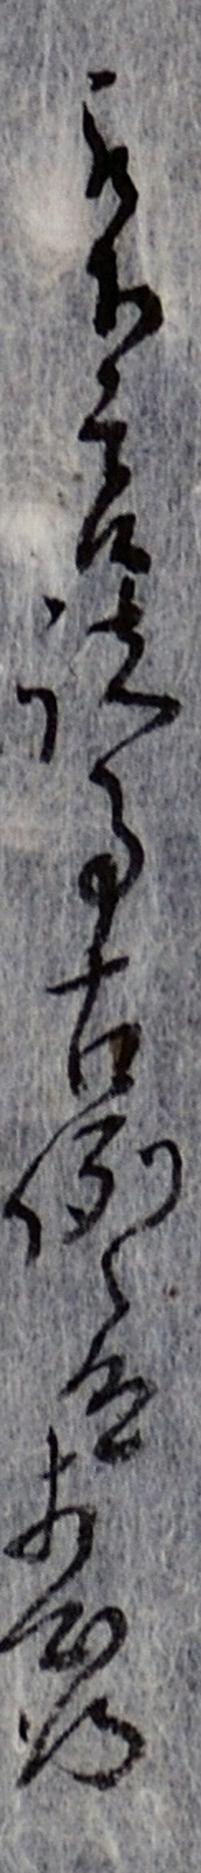被下候節諸事古例之通相心得
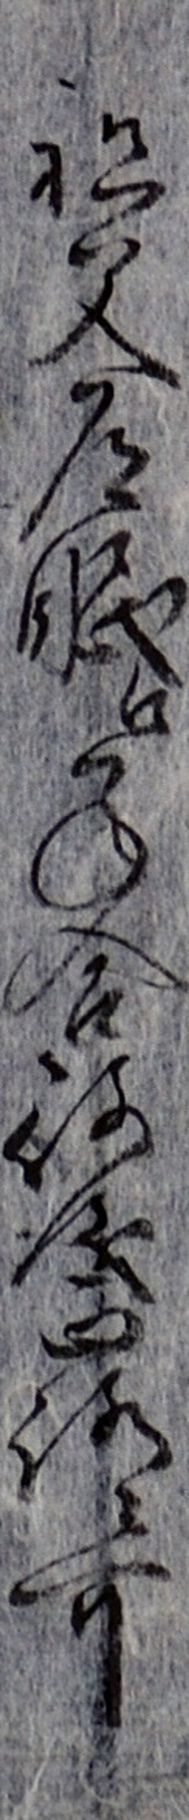祖父道眼付承合役儀正路ニ可
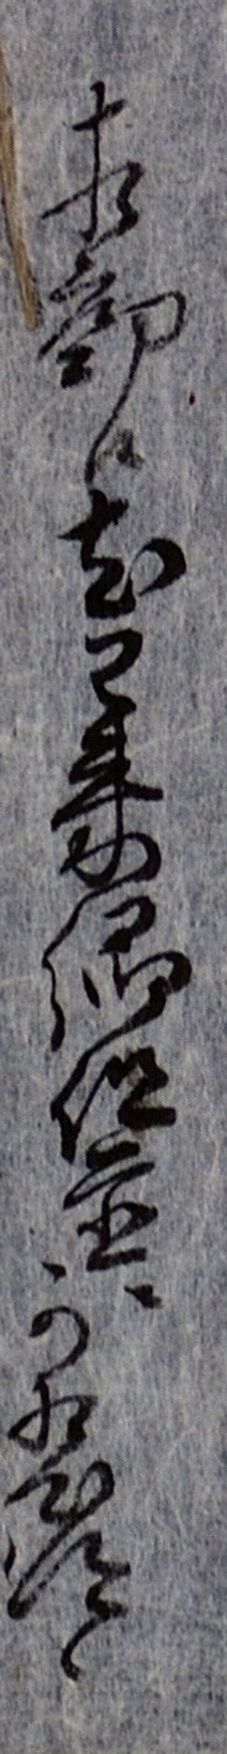相勤候尤已来郷組置ニ可相心得候
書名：覚
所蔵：伊那市立高遠町図書館・合同会社AMANE
